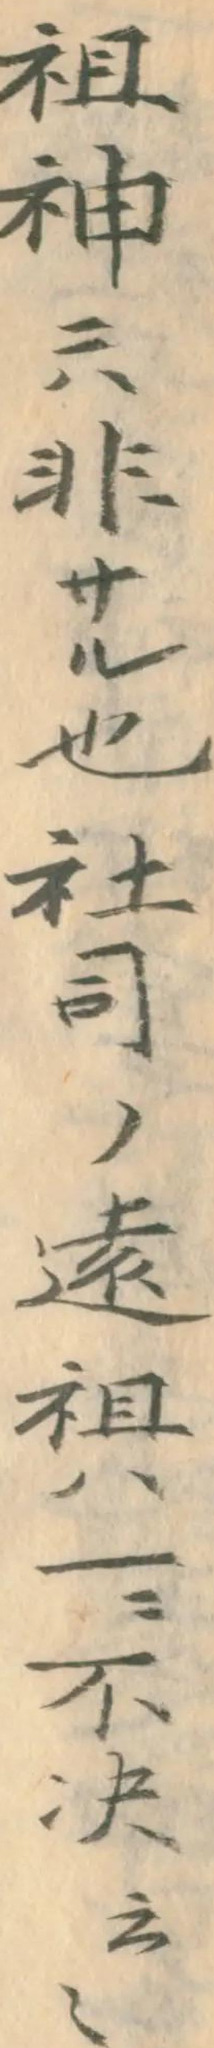祖神ニハ非サル也社司ノ遠祖ハ一ニ不決云々
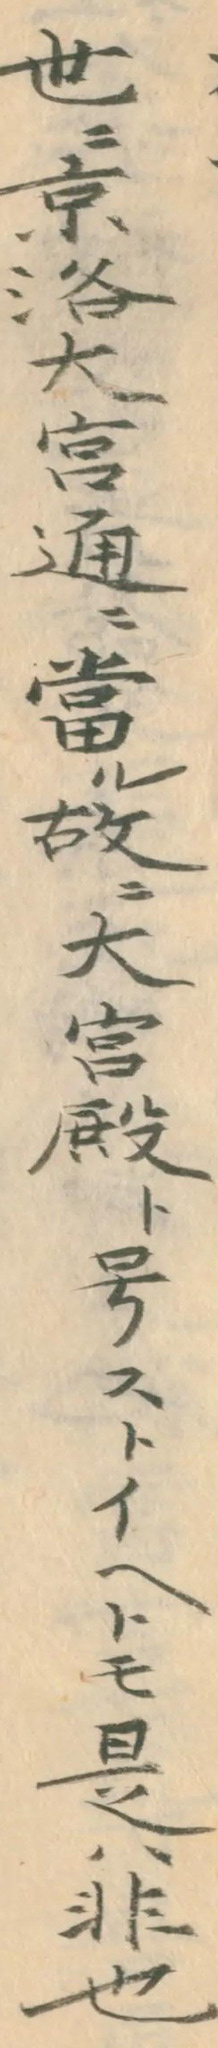世ニ京洛大宮通ニ当ル故ニ大宮殿ト号ストイヘトモ是ハ非也
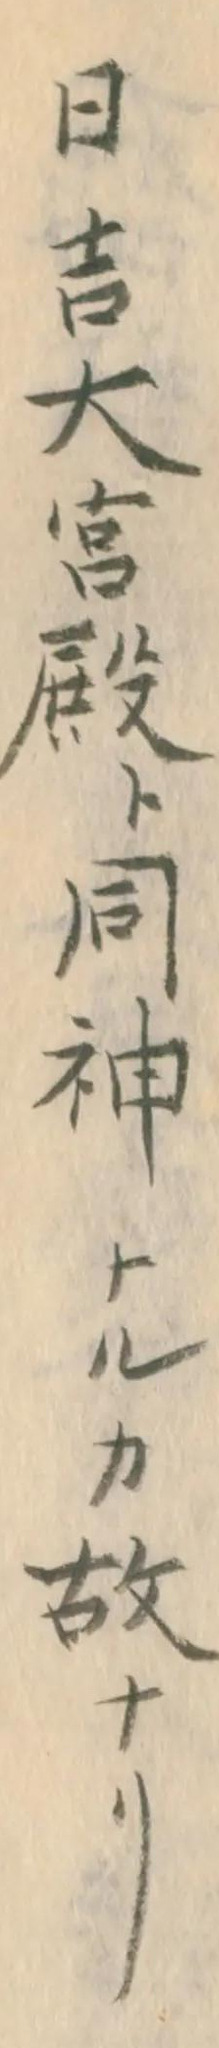日吉大宮殿ト同神ナルカ故ナリ
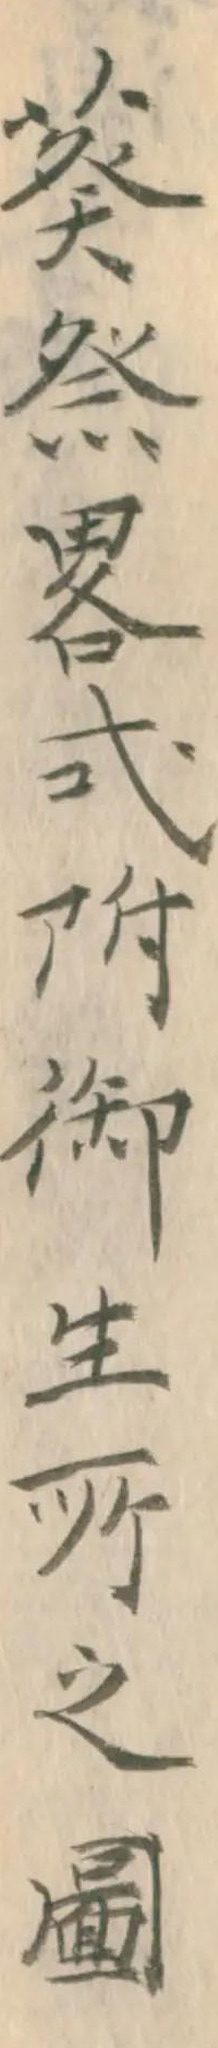葵祭略式附御生所之図
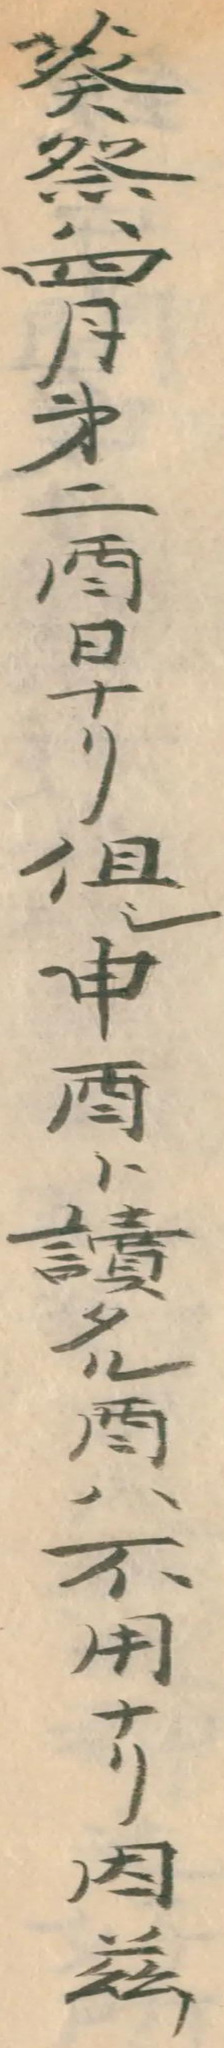葵祭ハ四月第二酉日ナリ但シ申酉ト読タル酉ハ不用ナリ因茲
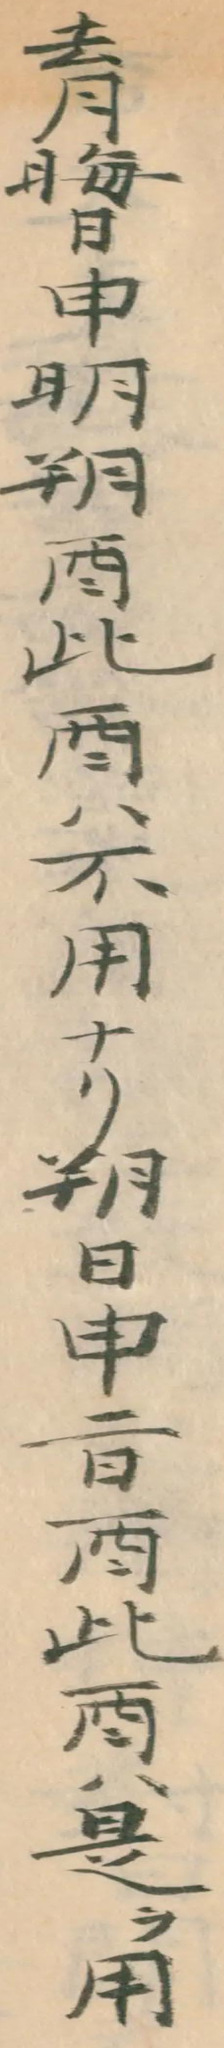去月晦日申明朔酉此酉ハ不用ナリ朔日申二日酉此酉ハ是ヲ用
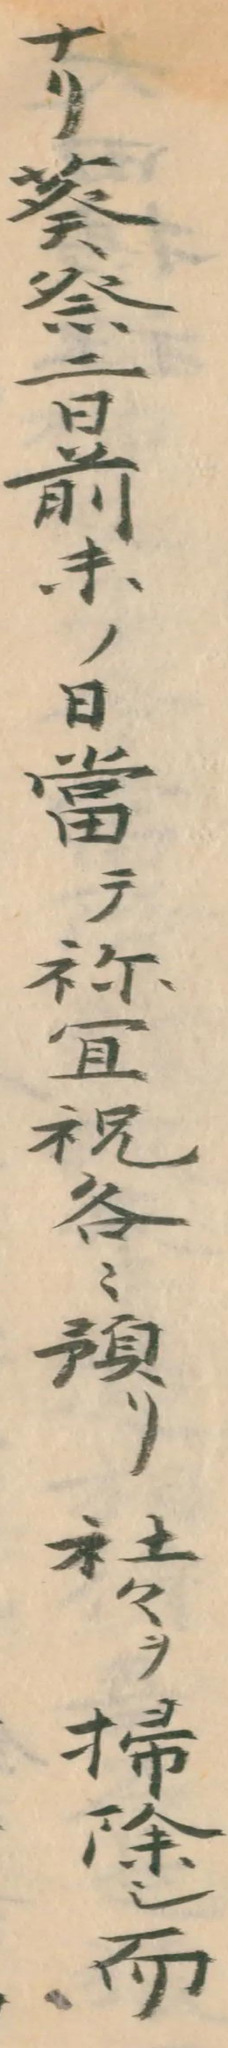ナリ葵祭二日前未ノ日当テ称宜祝各々預リ社々ヲ掃除シ而
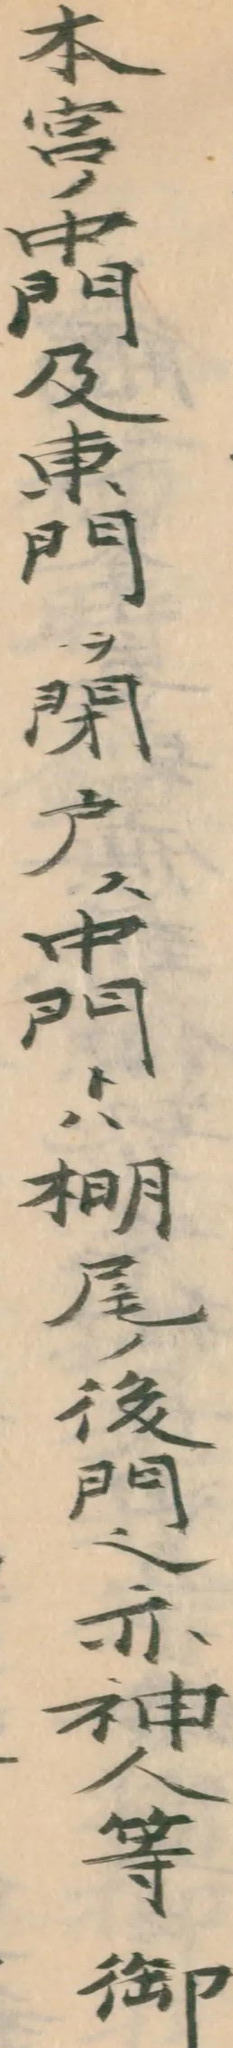本宮ノ中門及東門ヲ閉戸ス中門トハ棚尾ノ後門也亦神人等御
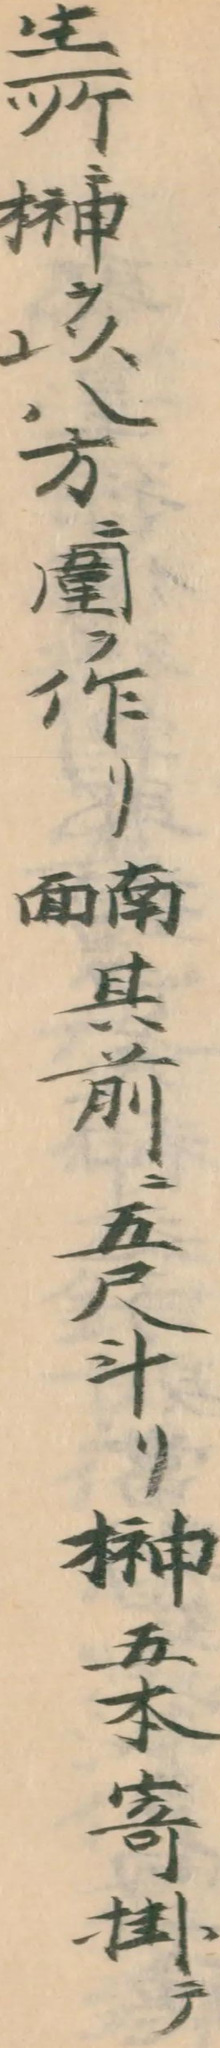生所ニ榊ヲ以八方ニ囲ヲ作リ南面其前ニ五尺斗リ榊五本寄掛テ
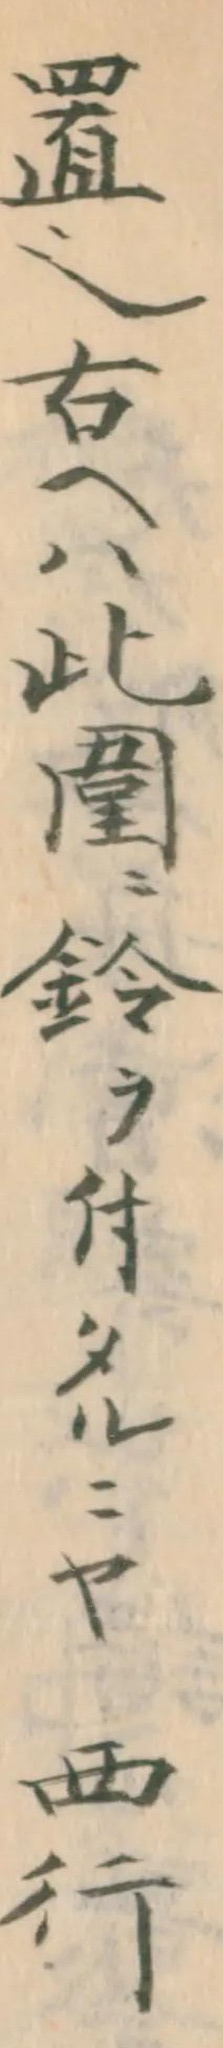置也古ヘハ此囲ニ鈴ヲ付タルニヤ西行
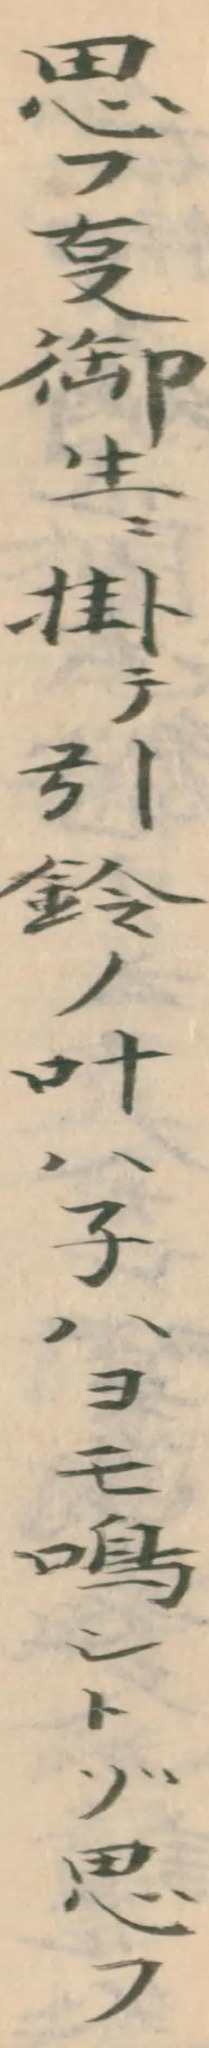思フ事御生ニ掛テ引鈴ノ叶ハネハヨモ鳴ントゾ思フ
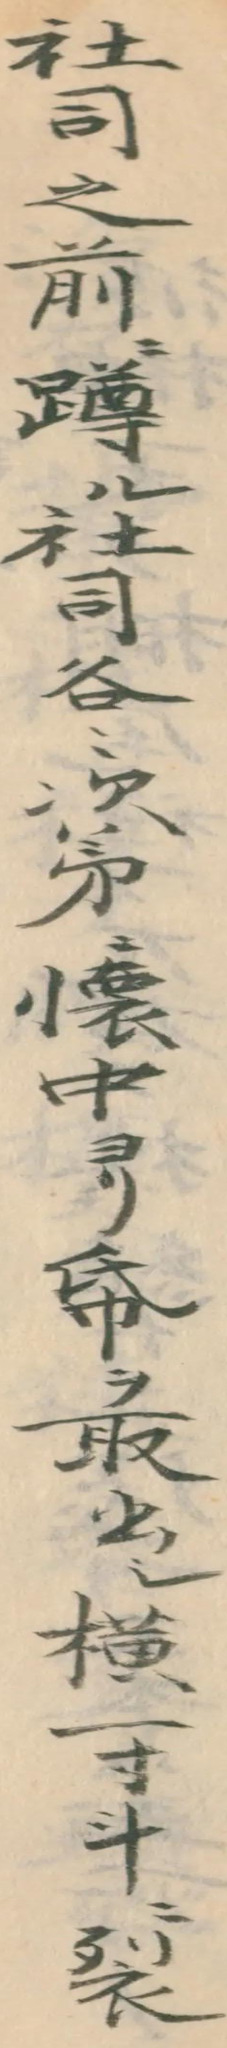社司之前ニ蹲ル社司各々次第ニ懐中ヨリ紙ヲ取出シ横一寸斗ニ裂
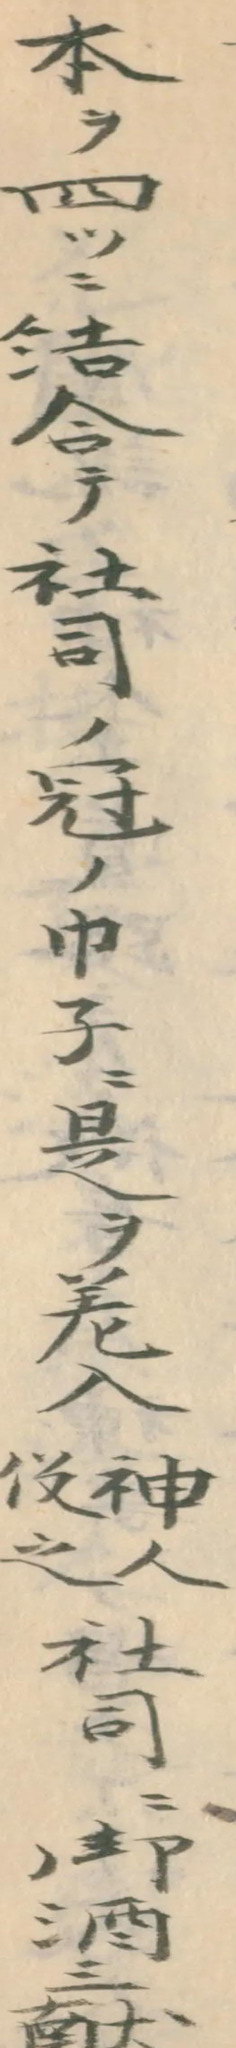本ヲ四ツニ結合テ社司ノ冠ノ巾子ニ是ヲ差入神人役之社司ニ御酒三献
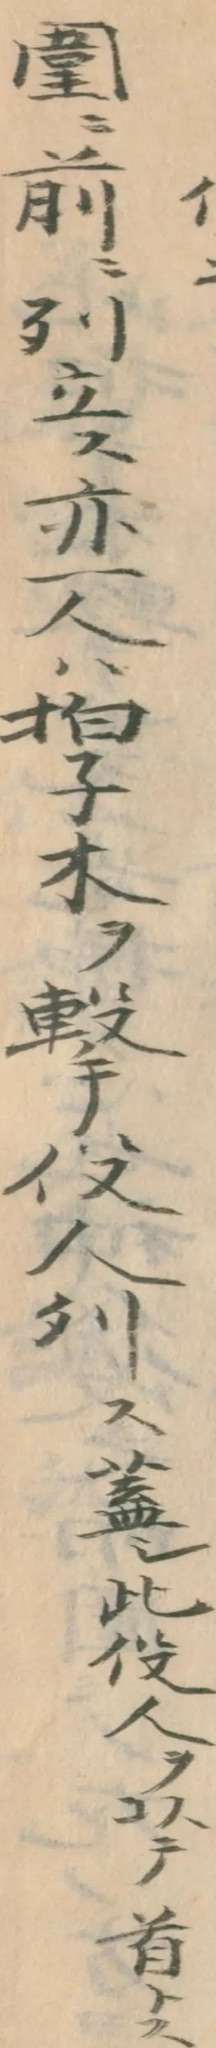囲ニ前ニ列立ス亦一人ハ拍子木ヲ撃役人列ス蓋シ此役人ヲ以テ首トス

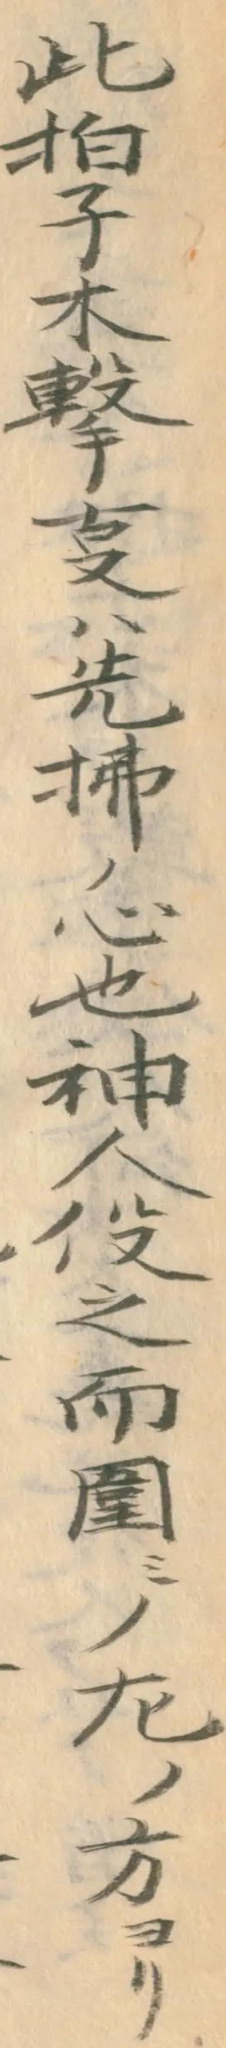此拍子木撃事ハ先払ノ心也神人役之而囲ミノ左ノ方ヨリ
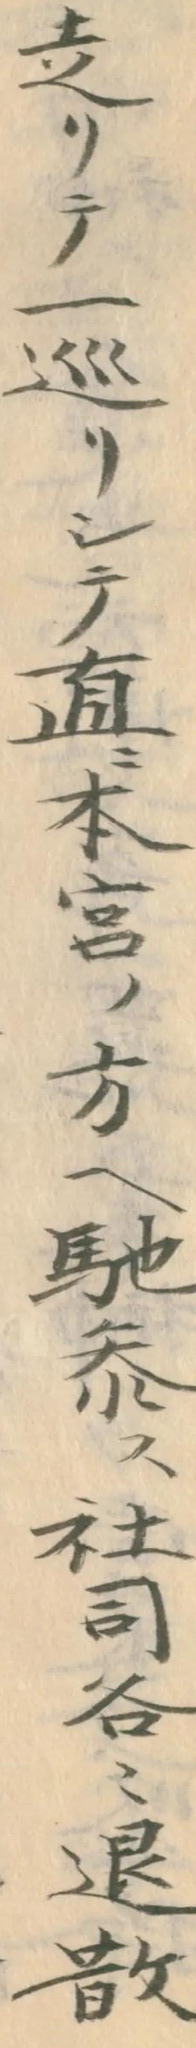走リテ一巡リシテ直ニ本宮ノ方ヘ馳参ス社司各々退散
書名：賀茂社記録. 第91冊
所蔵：国立国会図書館 National Diet Library, JAPAN
